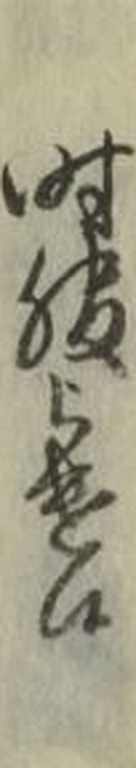時服被遣候
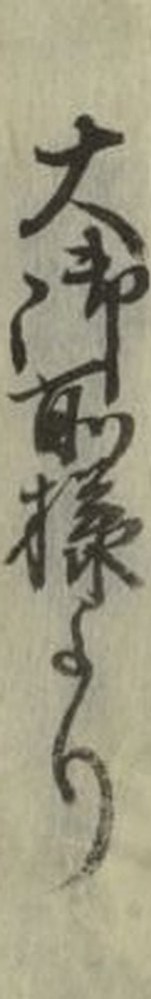大御所様より
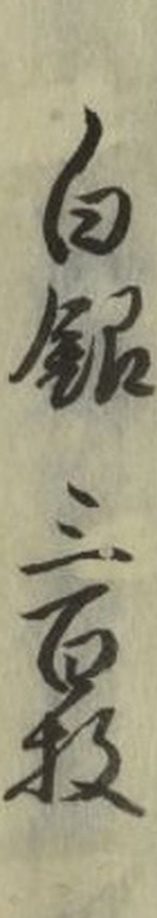白銀三百枚

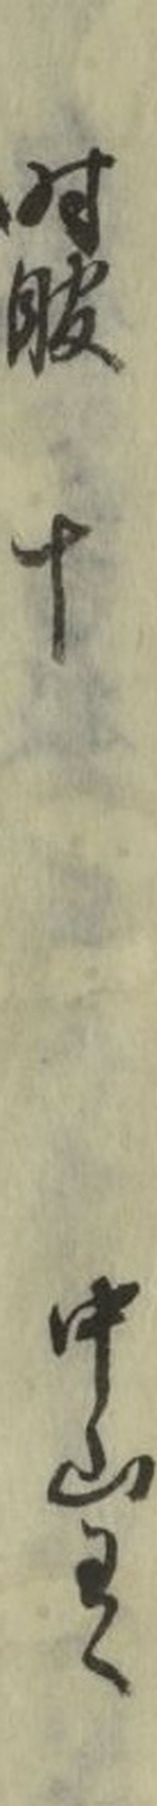時服十中山王へ
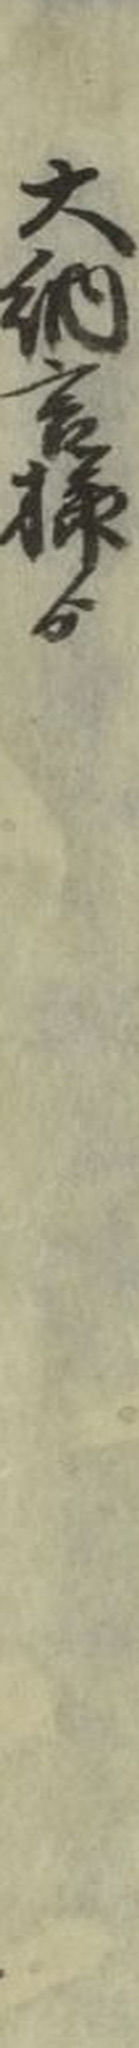大納言様ゟ
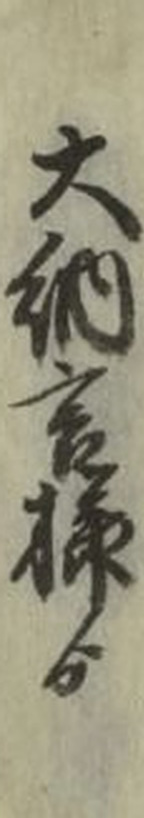大納言様ゟ
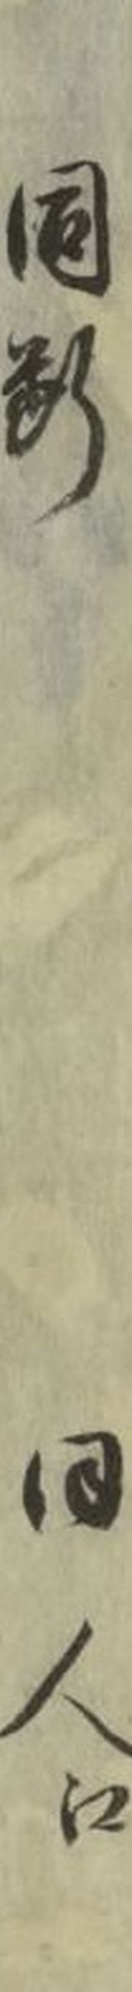同断同人え
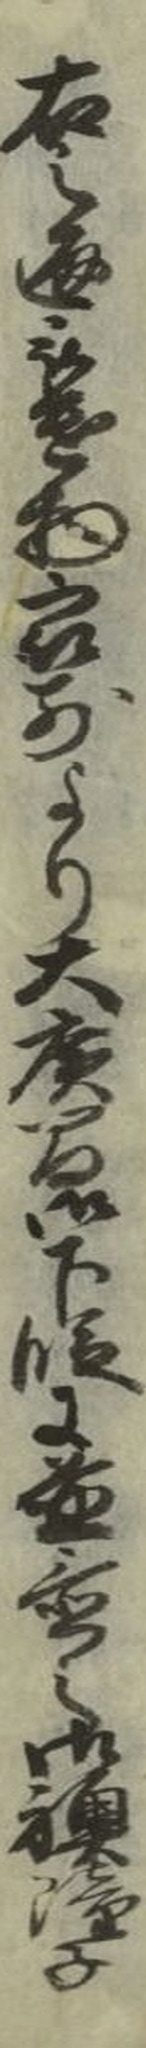右之通被遣物衆前より大広間御下段に並置之御襖障子
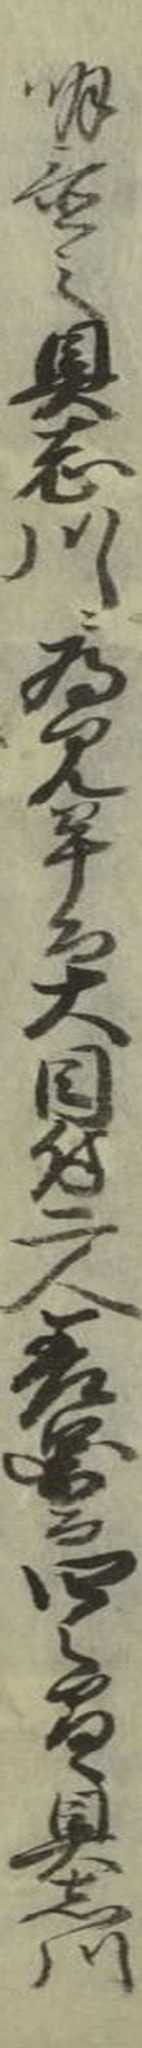明置之具志川に為見畢而大目付二人差図而四之間へ具志川
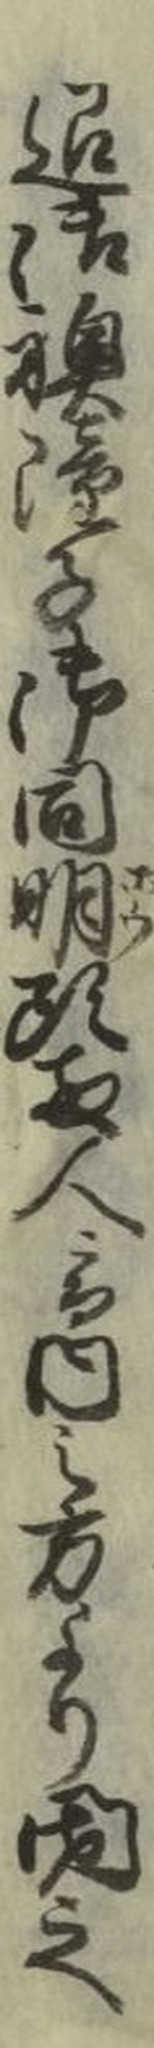退御襖障子御同朋頭両人に而内之方より閉之
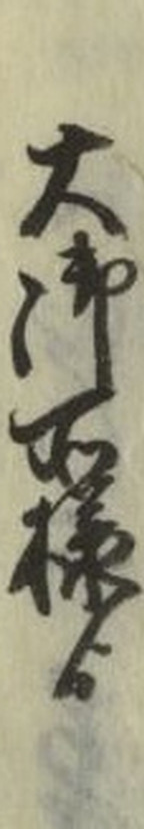大御所様ゟ
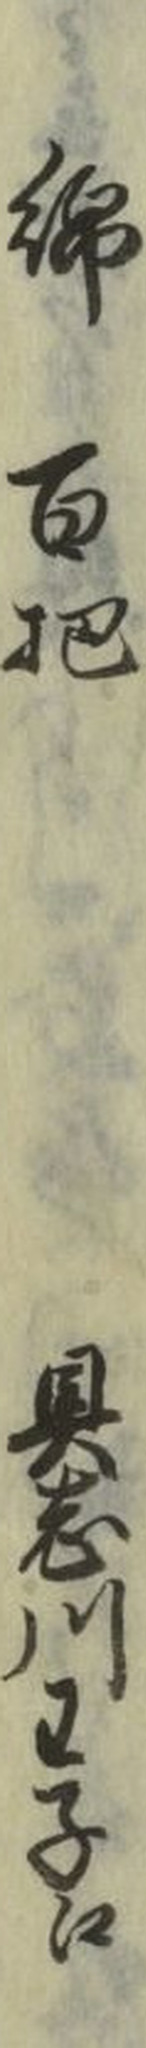綿百把具志川王子え
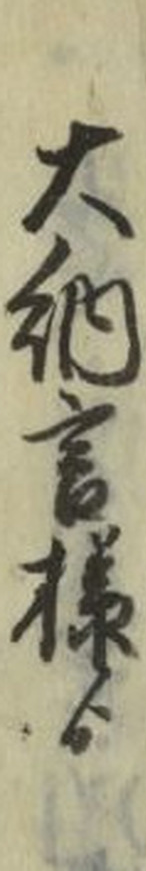大納言様ゟ
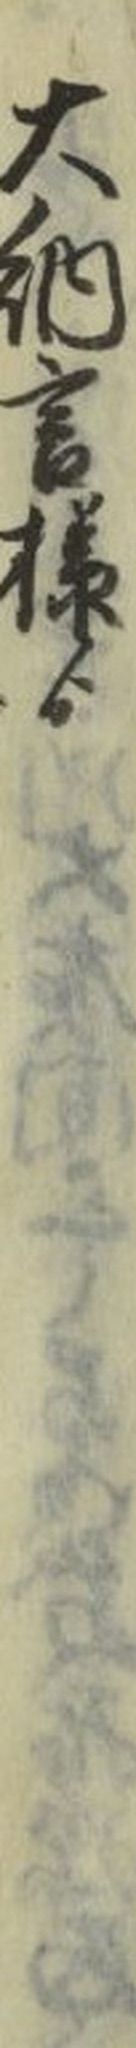大納言様ゟ
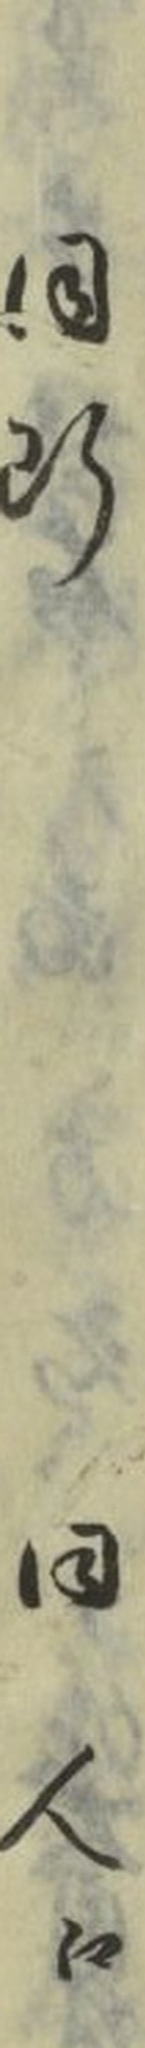同断同人え
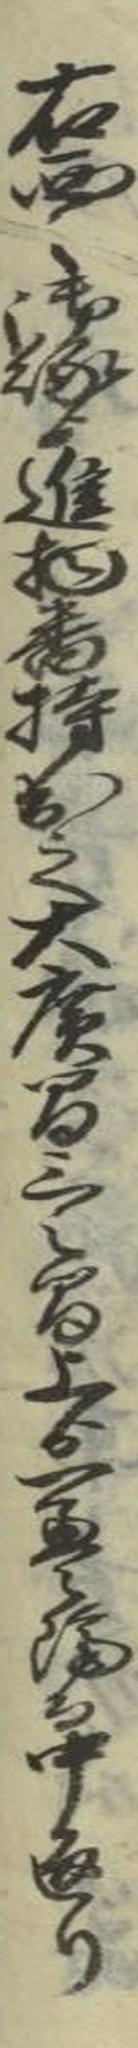右西之御縁ゟ進物番持出之大広間三之間上ゟ一畳隔而中通り
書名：琉球人来朝之記
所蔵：University of the Ryukyus Library
